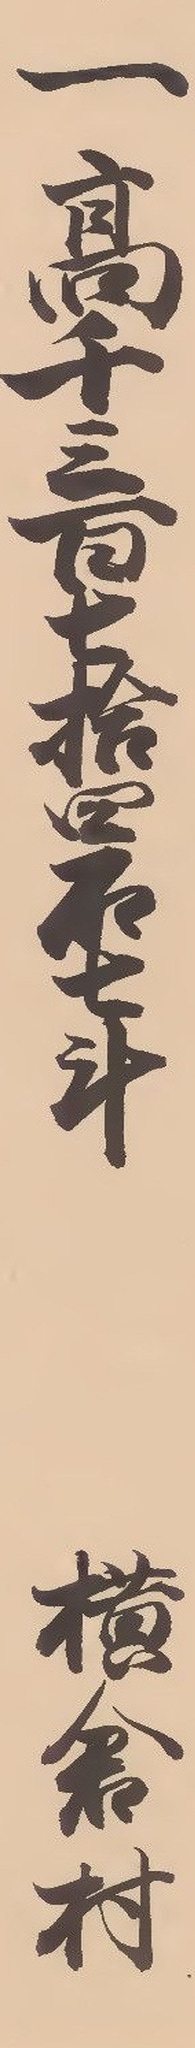一高千三百七拾四石七斗横倉村
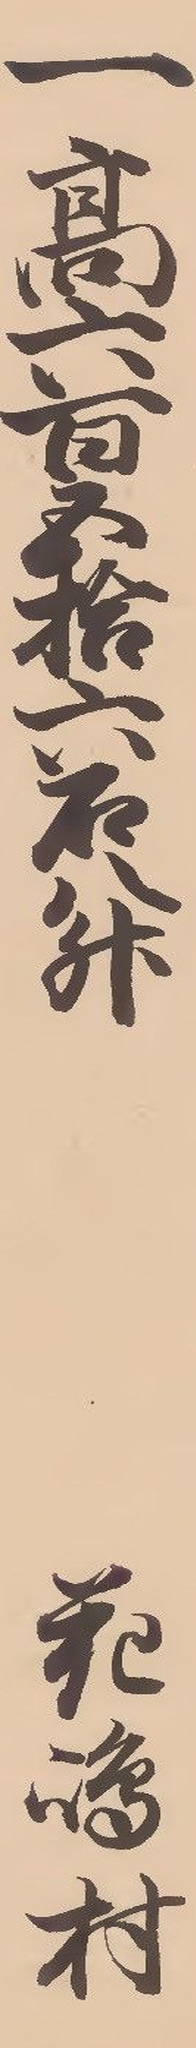一高六百五拾六石八升花島村
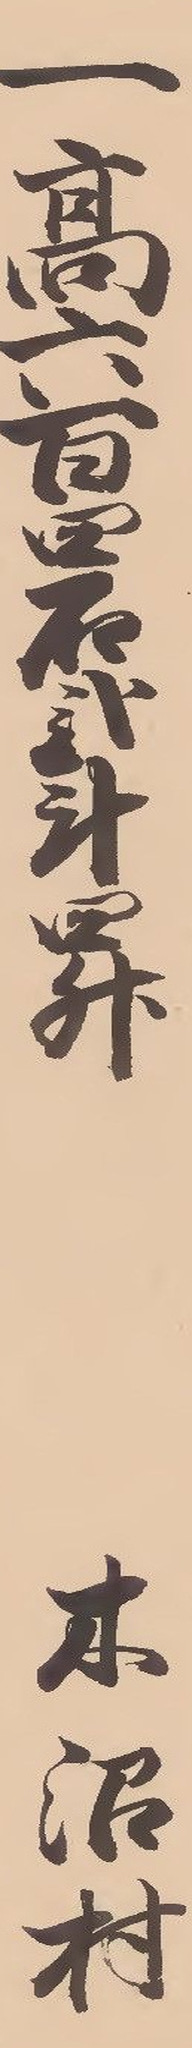一高六百四石弐斗四升木沼村
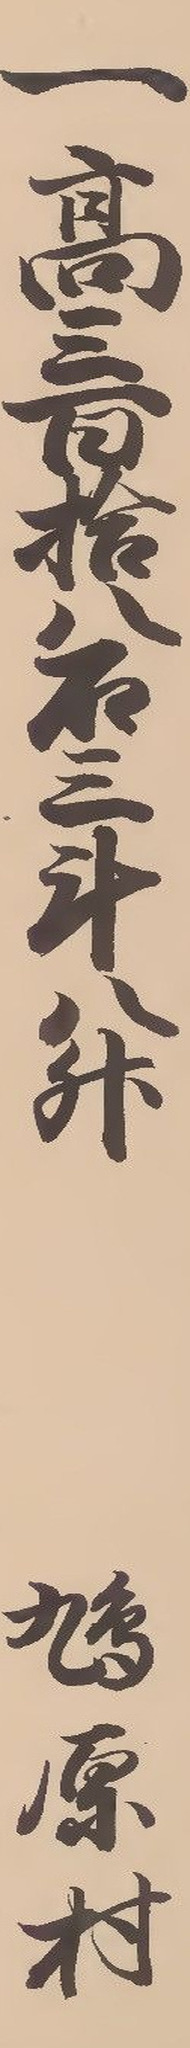一高三百拾八石三斗八升鳩原村
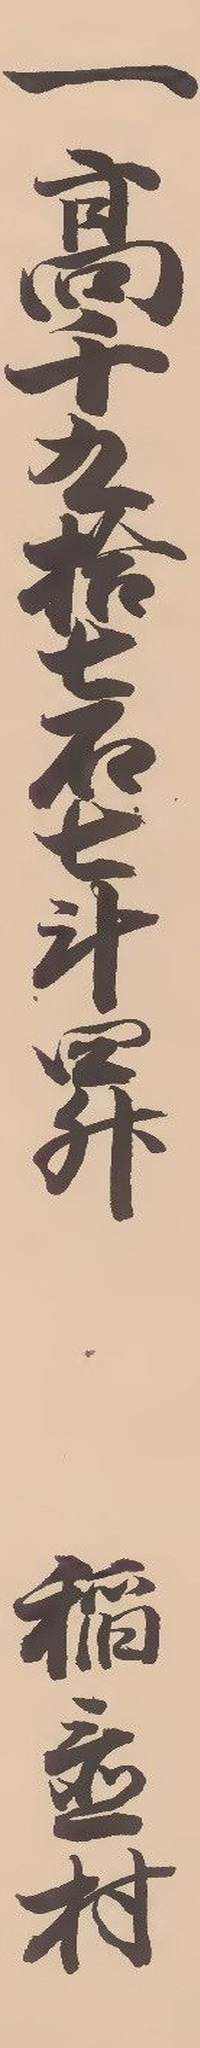一高千九拾七石七斗四升稲置村
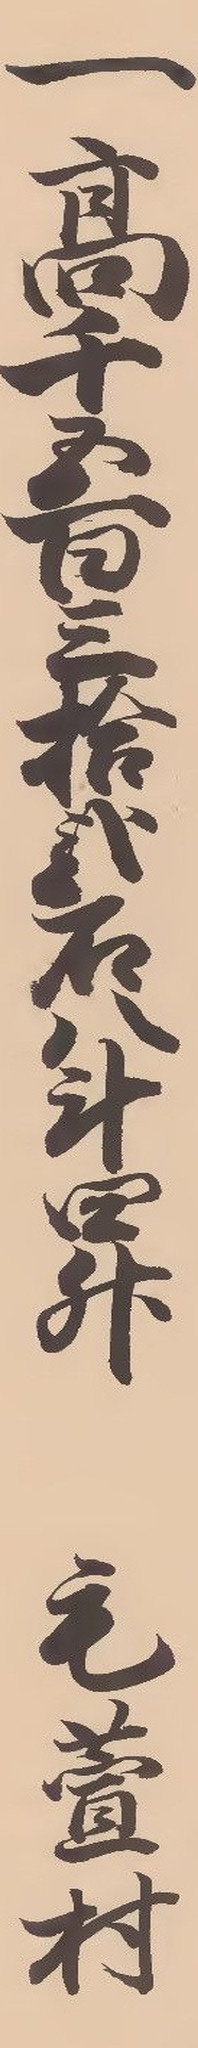一高千五百三拾弐石八斗四升毛萱村
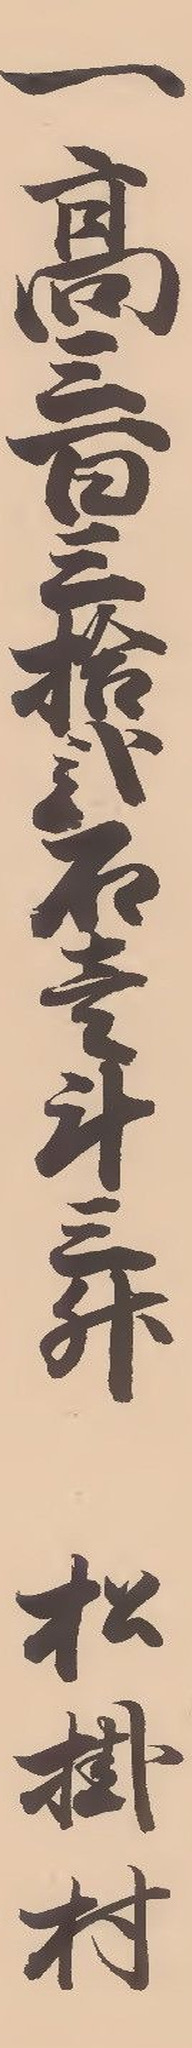一高三百三拾弐石壱斗三升松掛村

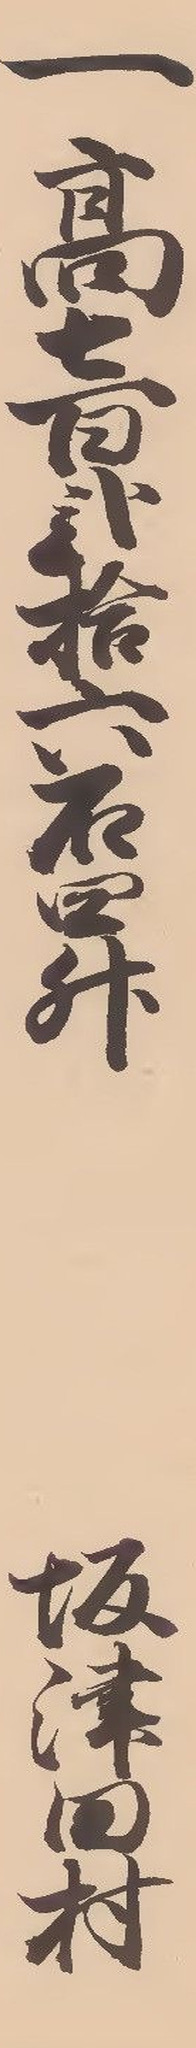一高七百弐拾六石四升坂津田村
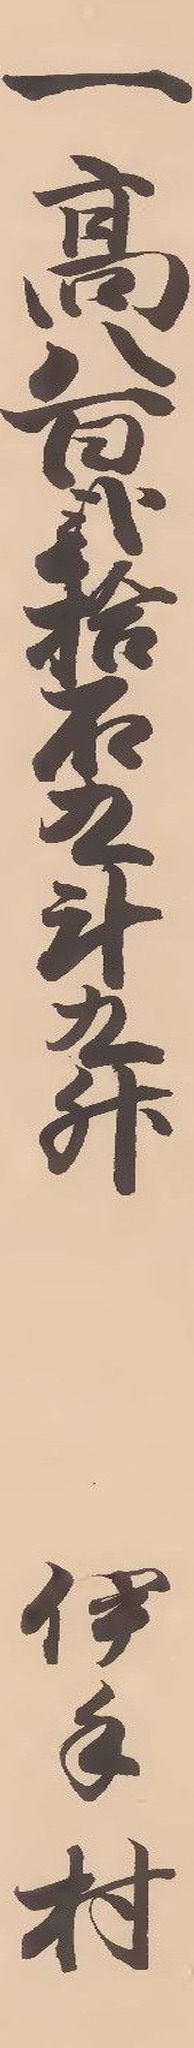一高八百弐拾石九斗九升伊手村
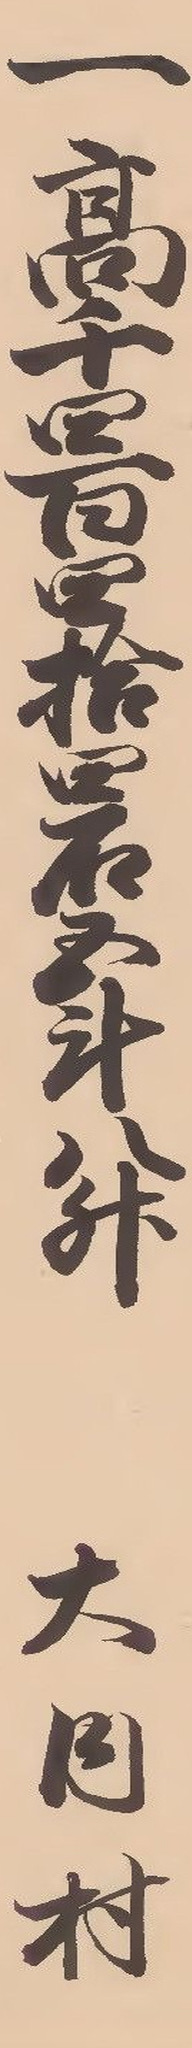一高千四百四拾四石五斗八升大内村
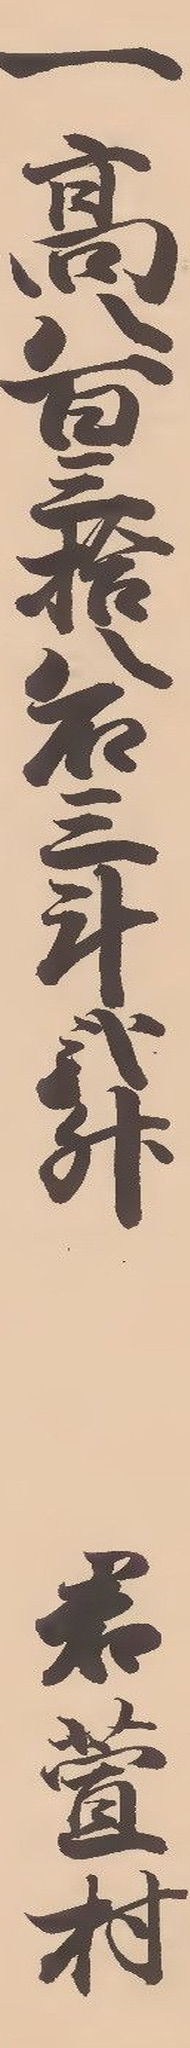一高八百三拾八石三斗弐升君萱村
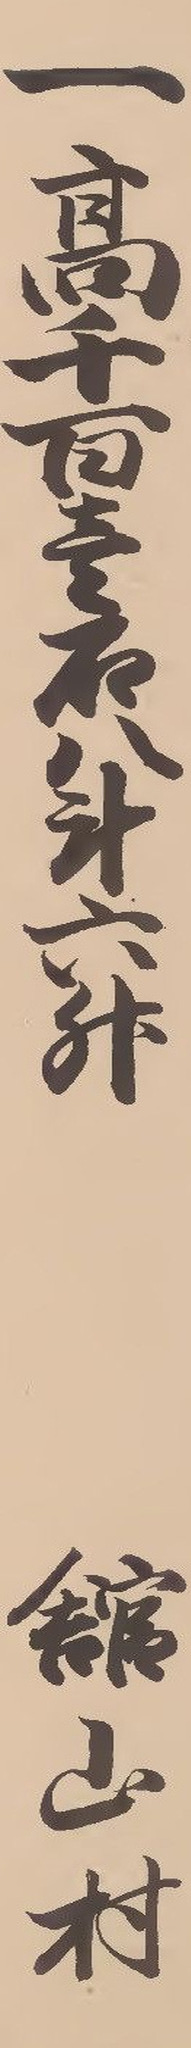一高千百壱石八斗六升舘山村
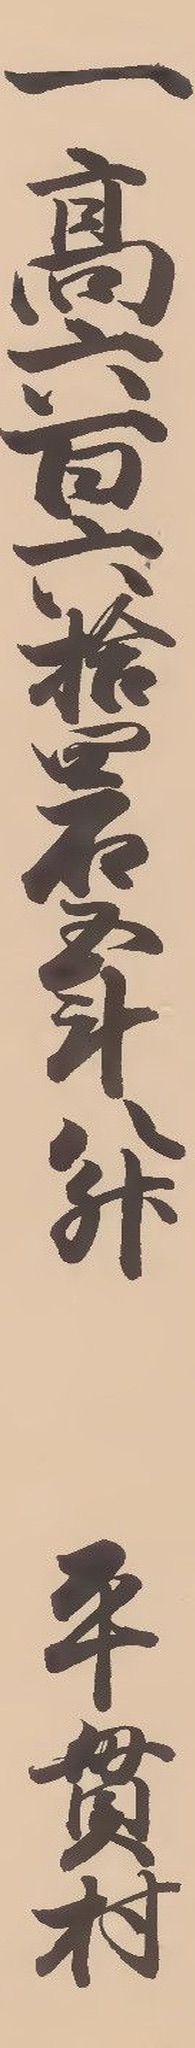一高六百六拾四石五斗八升平貫村
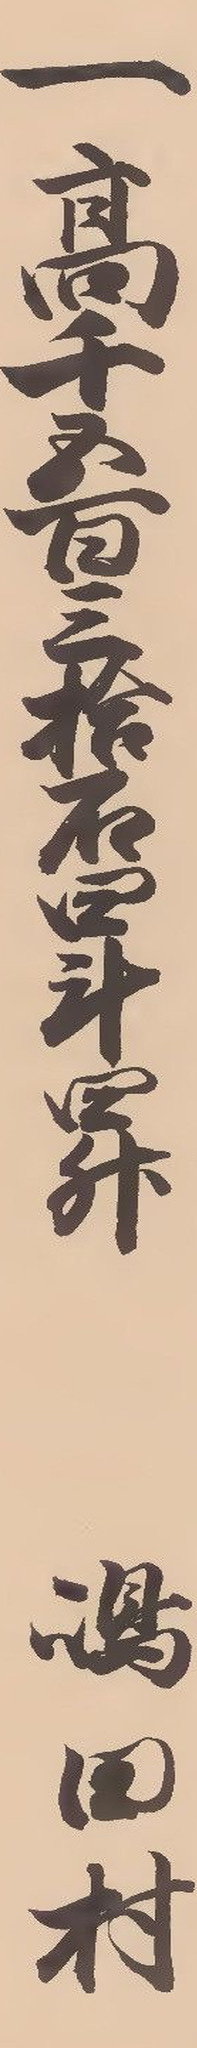一高千五百三拾石四斗四升島田村
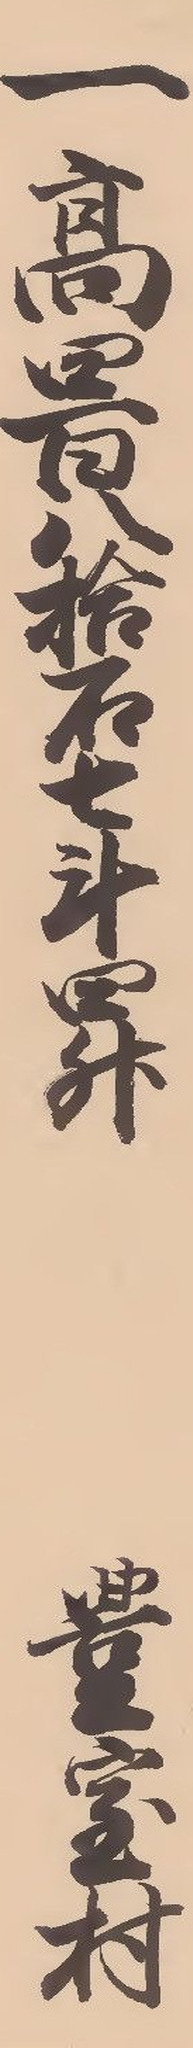一高四百八拾石七斗四升豊室村

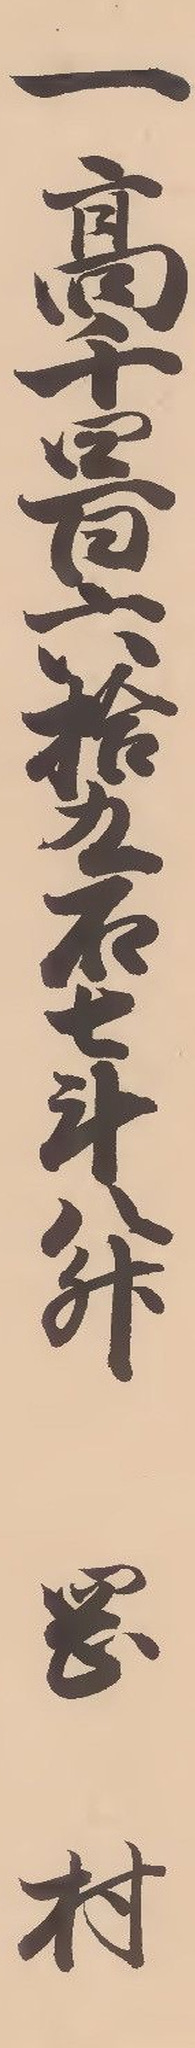一高千四百六拾九石七斗八升岡村
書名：陸奥国郷帳　５
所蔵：国立公文書館 National Archives of Japan
